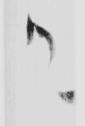人
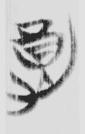勛
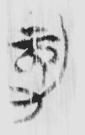勉
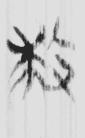救
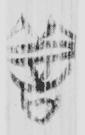善
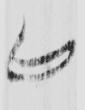㠯（以）
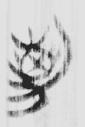{艸叀力}
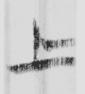上
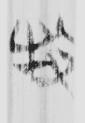牧
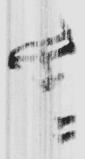民=
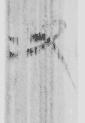又
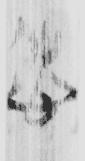{化心}
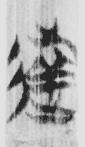{辶止㚔}
